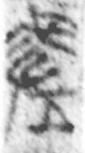差（佐）
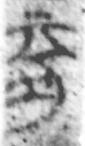坪
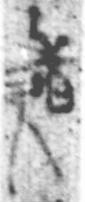造
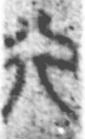行
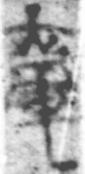𨍱（乘）
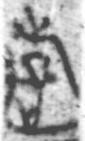遊
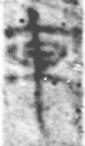車
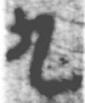九
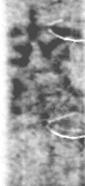𨍱（乘）
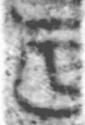○（圓）
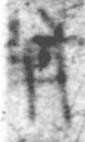軒
